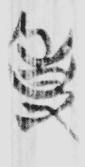事
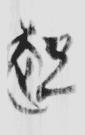起
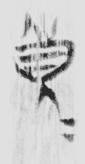貨=
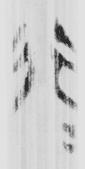行=
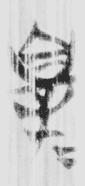辠=
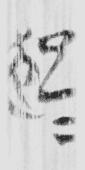起=
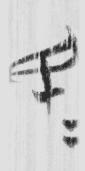民=
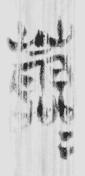蘦=
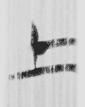上
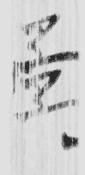危
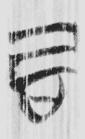{己口}
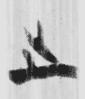之
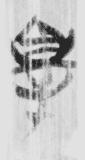辠
